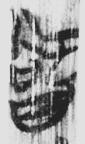智（知）
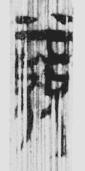競
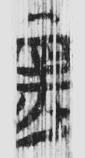坪（平）
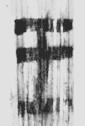王
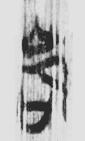命
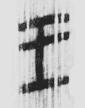王
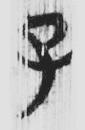子
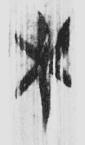木
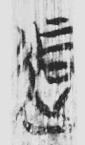○（跖）
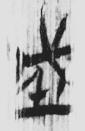城
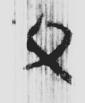父
